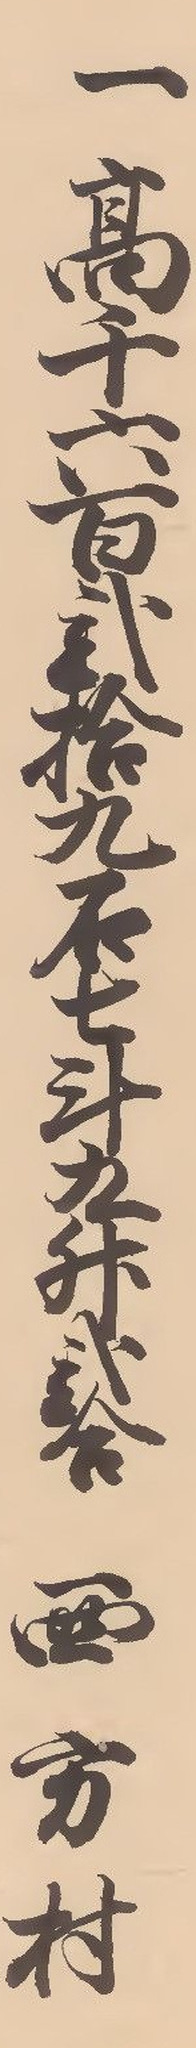一高千六百弐拾九石七斗九升弐合西方村
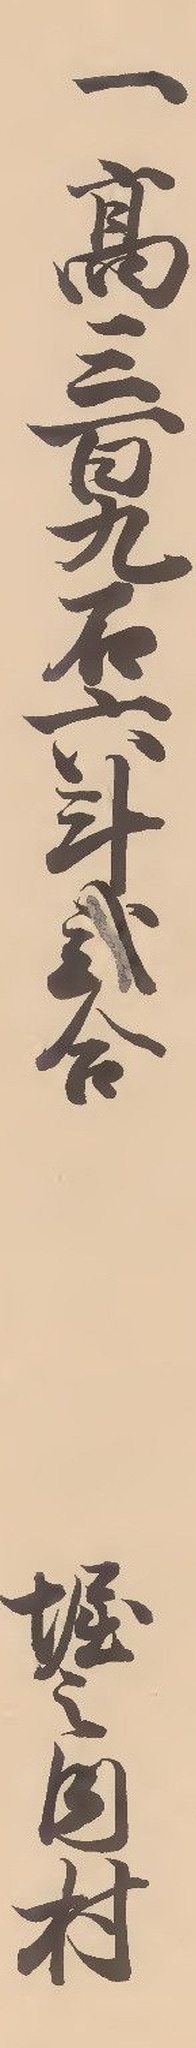一高三百九石六斗弐合堀之内村
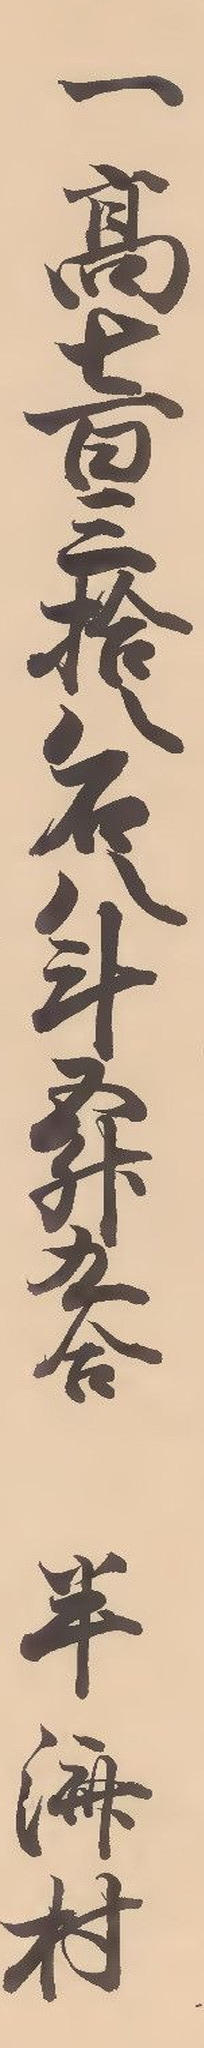一高七百三拾八石八斗五升九合半済村
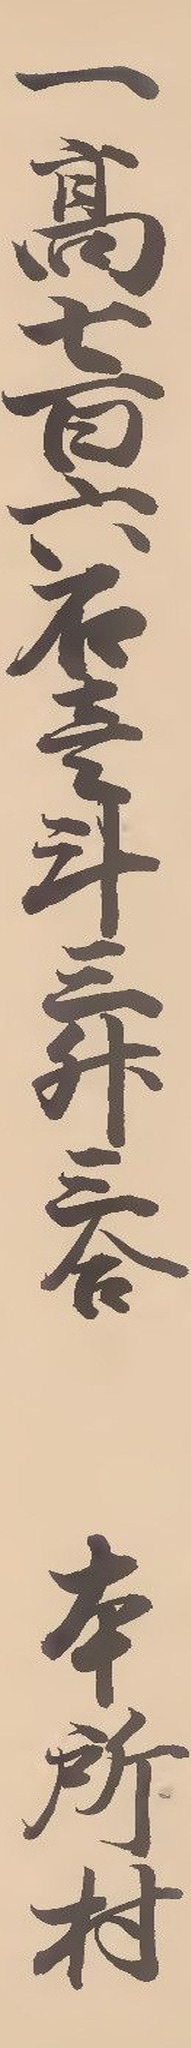一高七百六石壱斗三升三合本所村
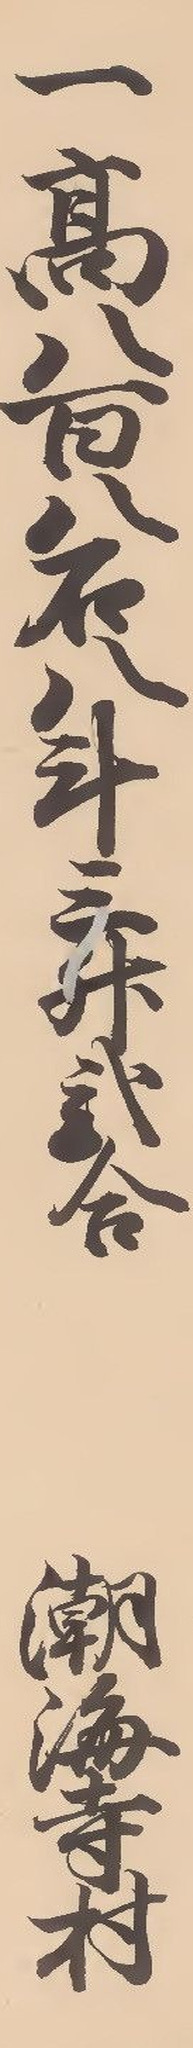一高八百八石八斗三升弐合潮海寺村
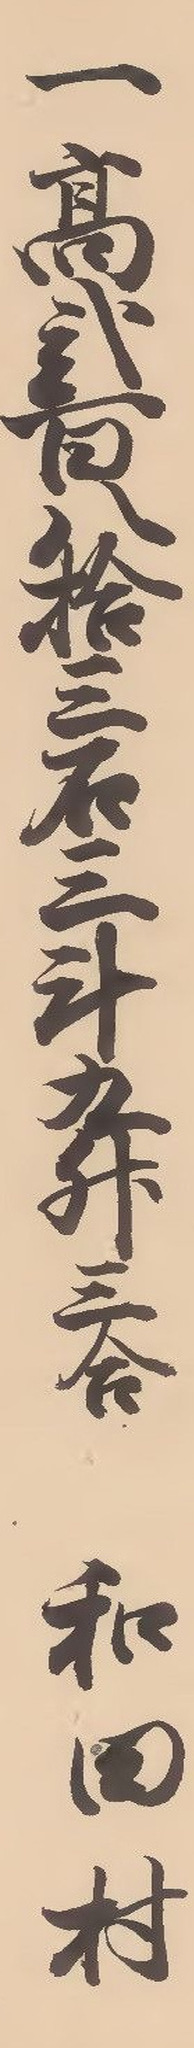一高弐百八拾三石三斗九升三合和田村
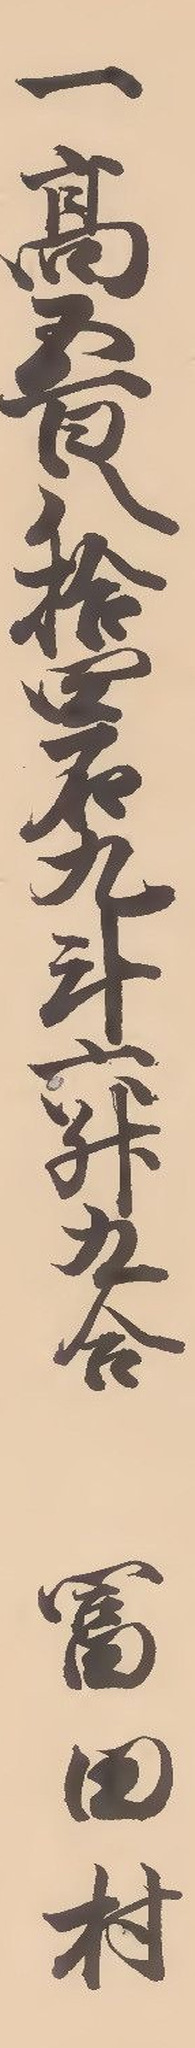一高五百八拾四石九斗六升九合富田村

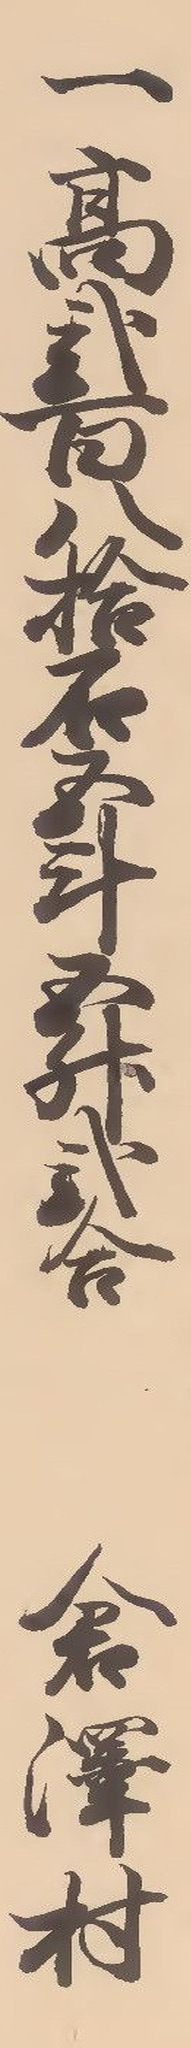一高弐百八拾石五斗五升弐合金沢村
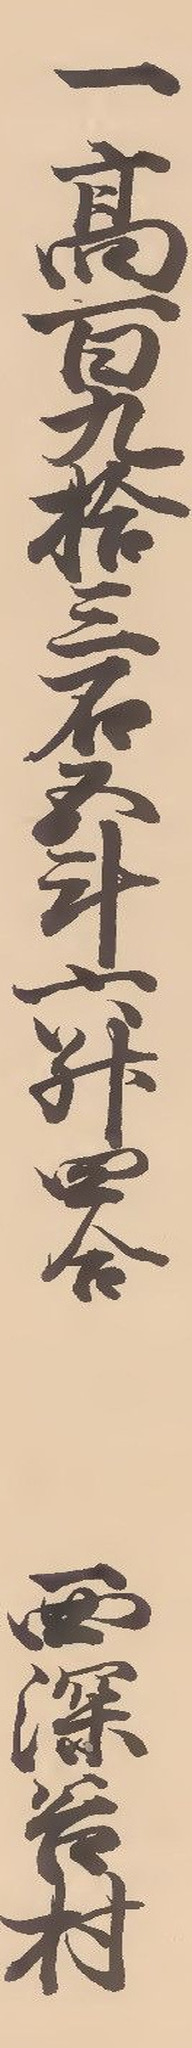一高百九拾三石五斗六升四合西深谷村
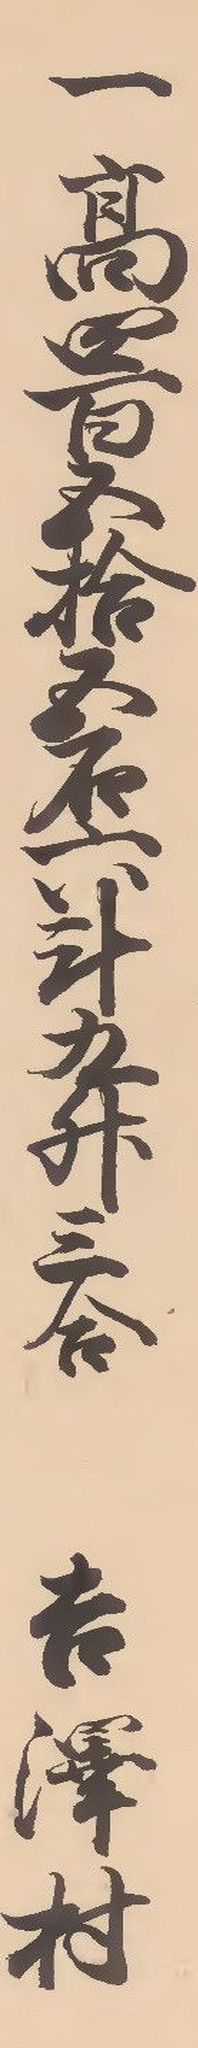一高四百五拾五石六斗九升三合吉沢村
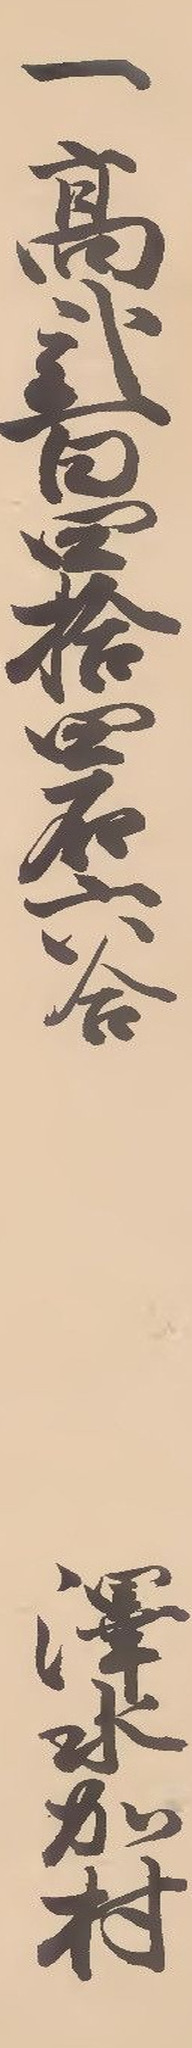一高弐百四拾四石六合沢水加村
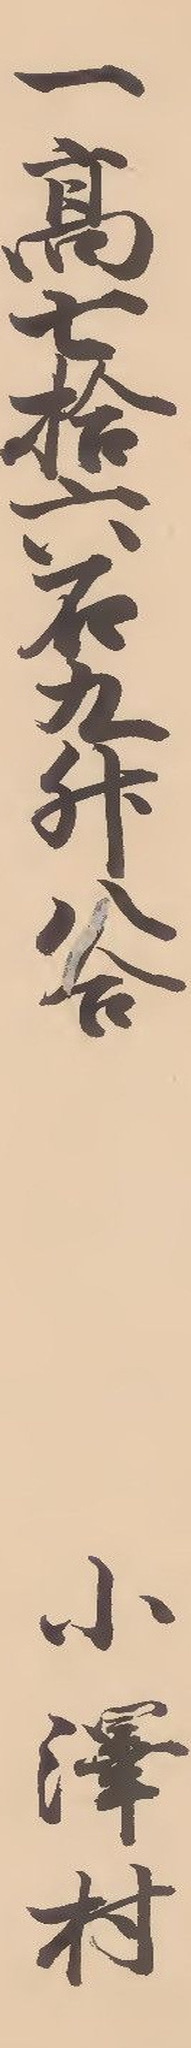一高七拾六石九升八合小沢村
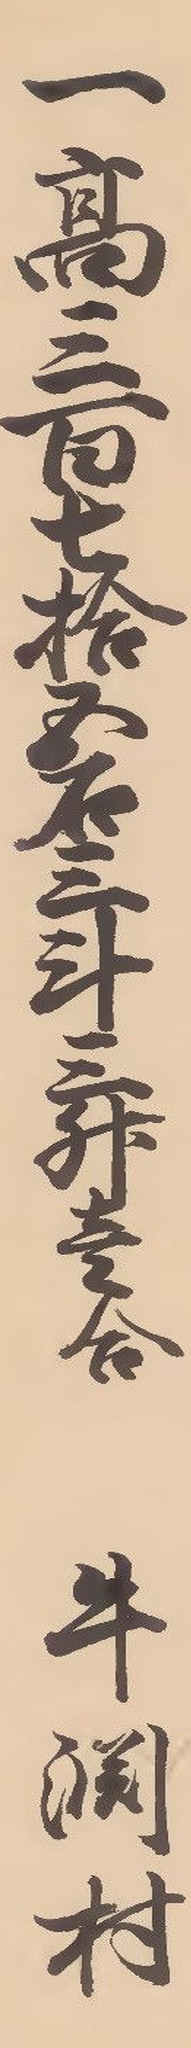一高三百七拾五石三斗三升壱合牛渕村
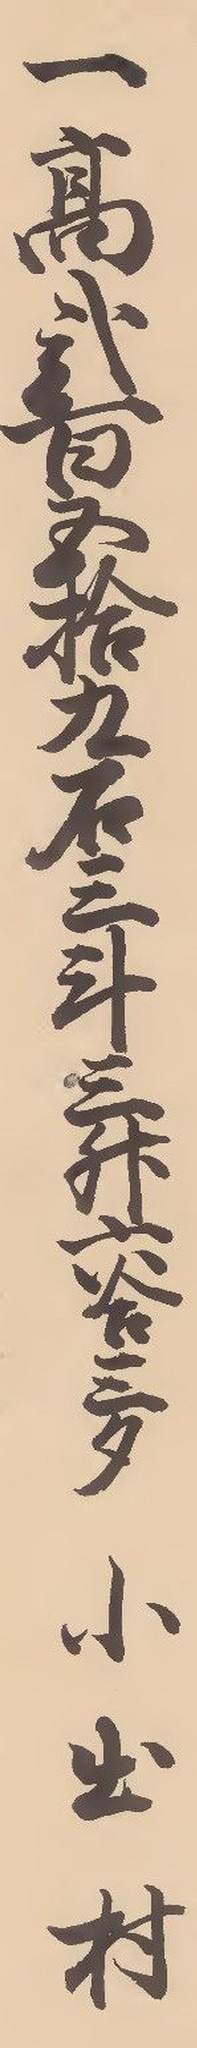一高弐百五拾九石三斗三升六合三勺小出村

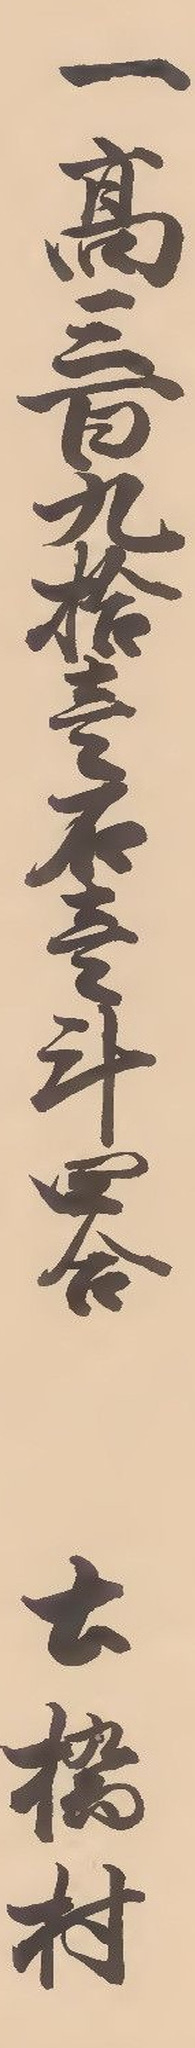一高三百九拾壱石壱斗四合土橋村
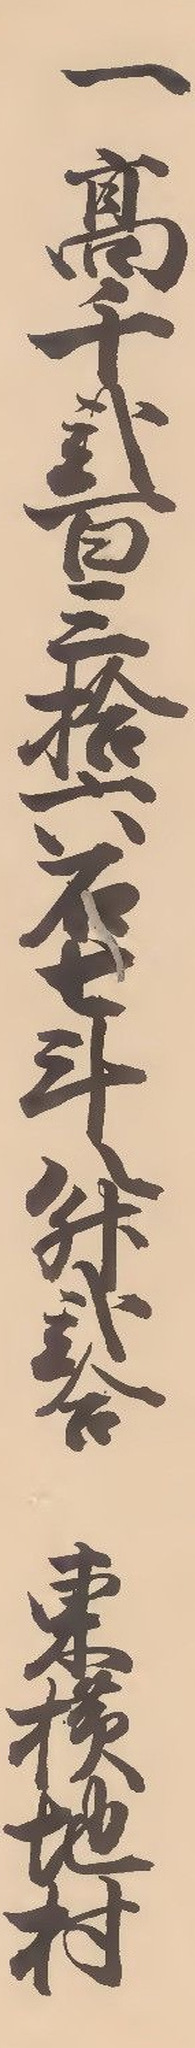一高千弐百三拾六石七斗八升弐合東横地村
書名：遠江国郷帳
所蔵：国立公文書館 National Archives of Japan
